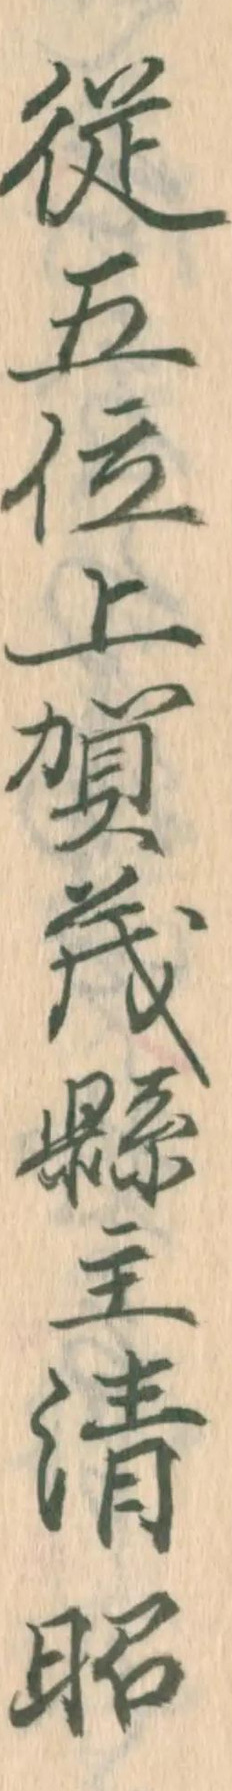従五位上賀茂県主清昭
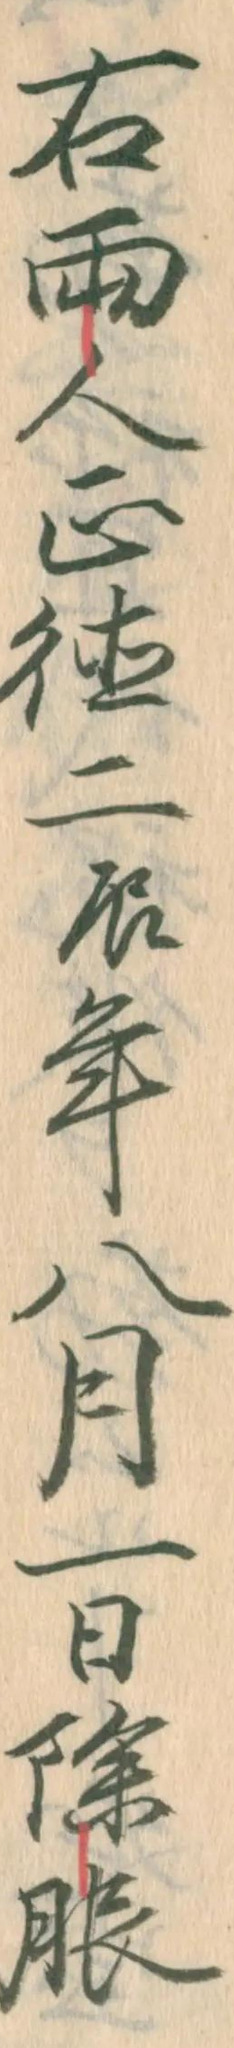右両-人正徳二辰年八月一日除-服
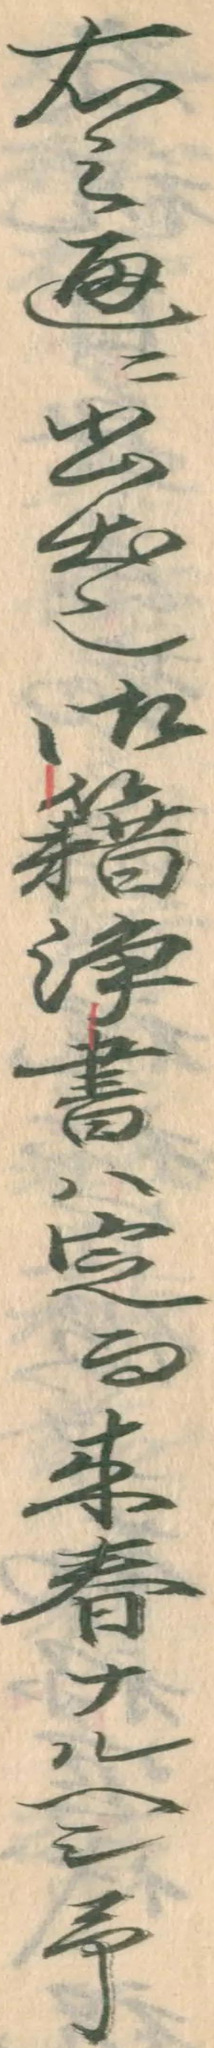右之通ニ書出也御_籍浄-書ハ定而来春ナルヘシ予

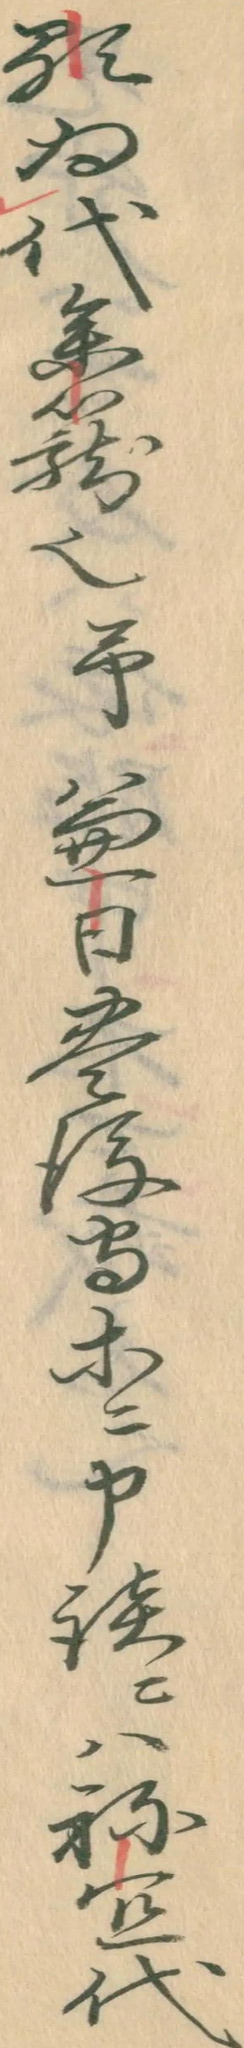顕為代参-籠也予兼-日豊後守等ニ申談ニハ祢-宜代
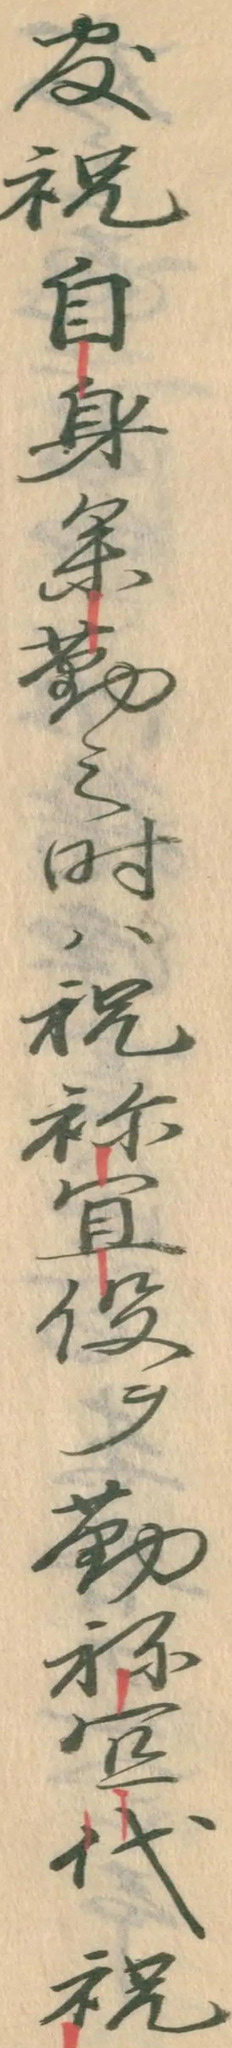官祝自-身参-勤之時ハ祝祢-宜-役ヲ勤祢-宜-代祝_
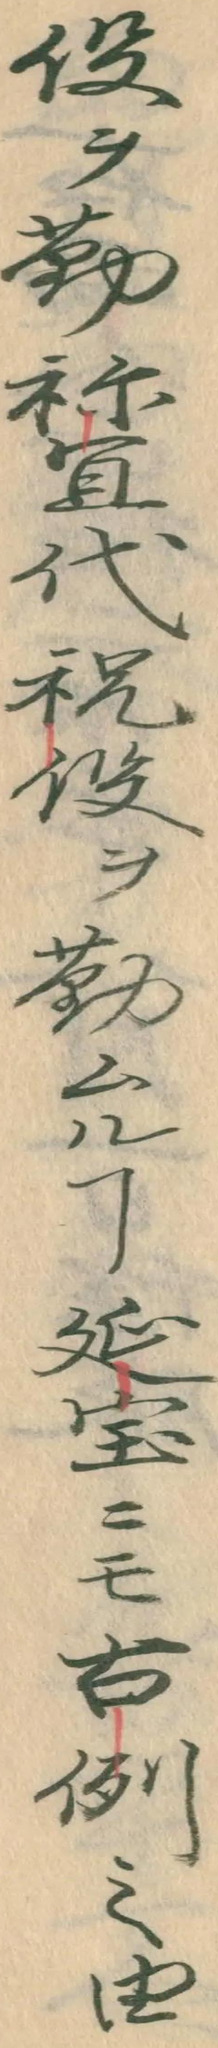役ヲ勤祢-宜代祝_役ヲ勤ムルコト延-宝ニモ古-例之由
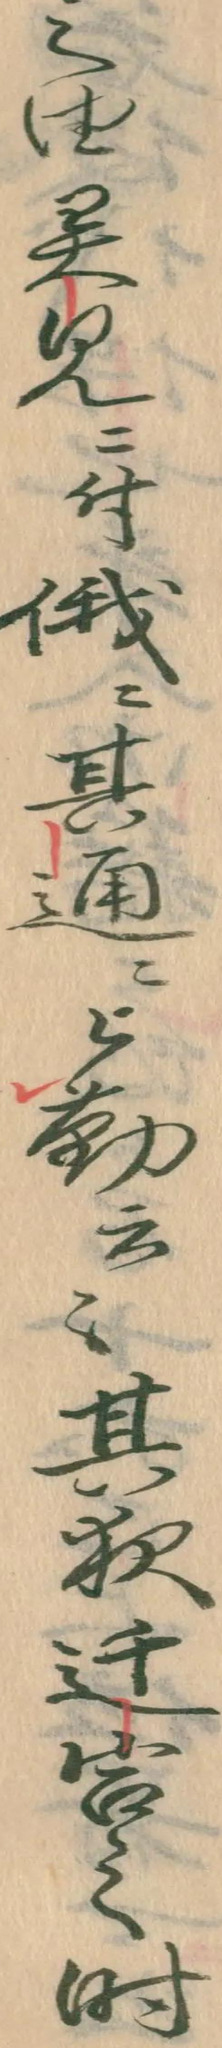之由異-見二付俄ニ其_通ニ被勤云々其夜迁-宮之時
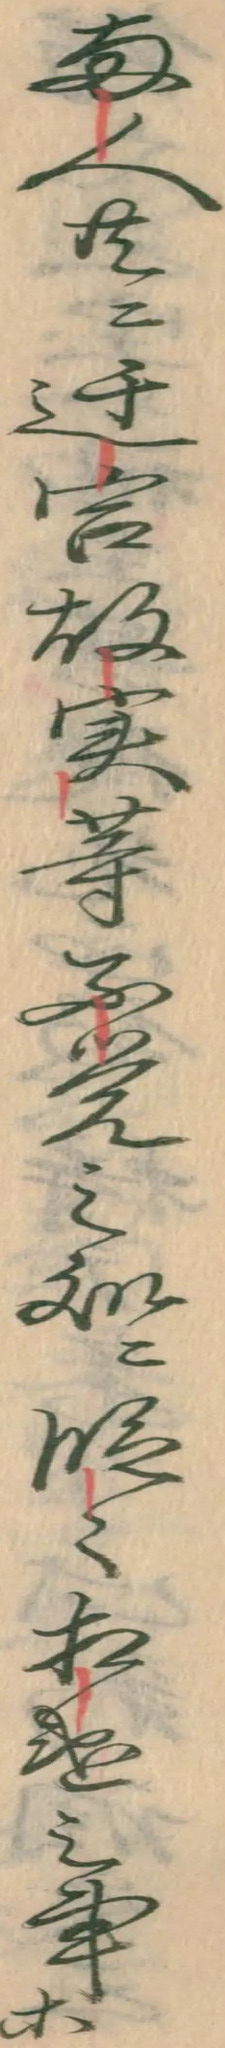両-人共ニ迁-宮故-実_等不-覚之処ニ段-々相_遣之事等

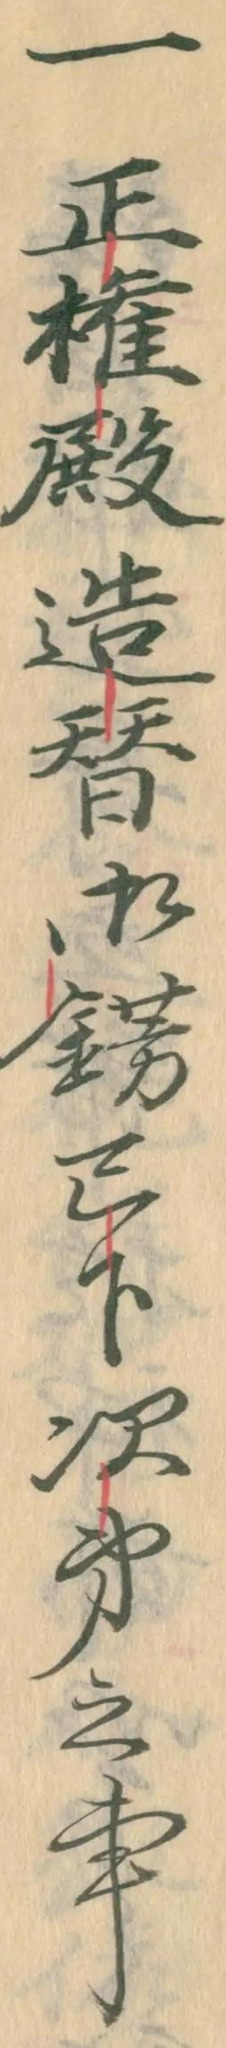一正-権-殿造-替御_錺已-下次-第之事
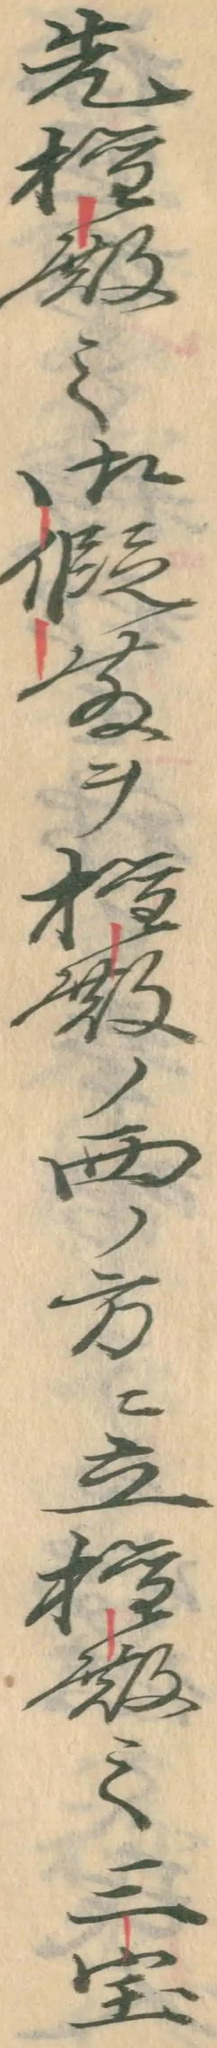先権-殿之御_仮_殿ヲ権-殿ノ西ノ方ニ立権-殿之三-宝
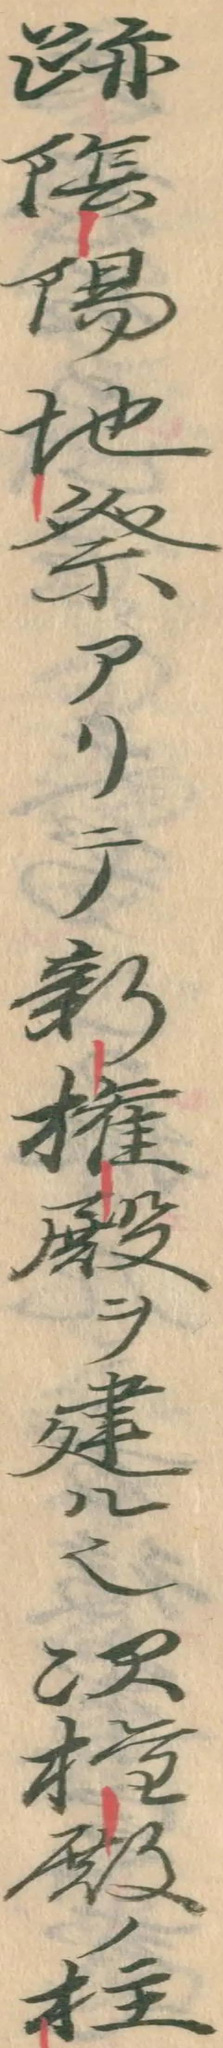跡陰-陽地_祭アリテ新-権-殿ヲ建ル也次権-殿ノ柱_
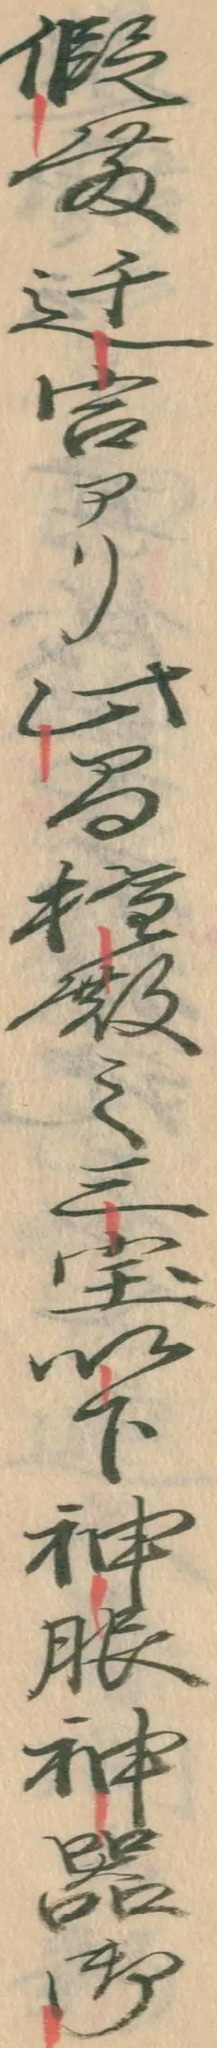仮_殿迁-宮アリ此_間権-殿之三-宝以-下神-服神-器御_
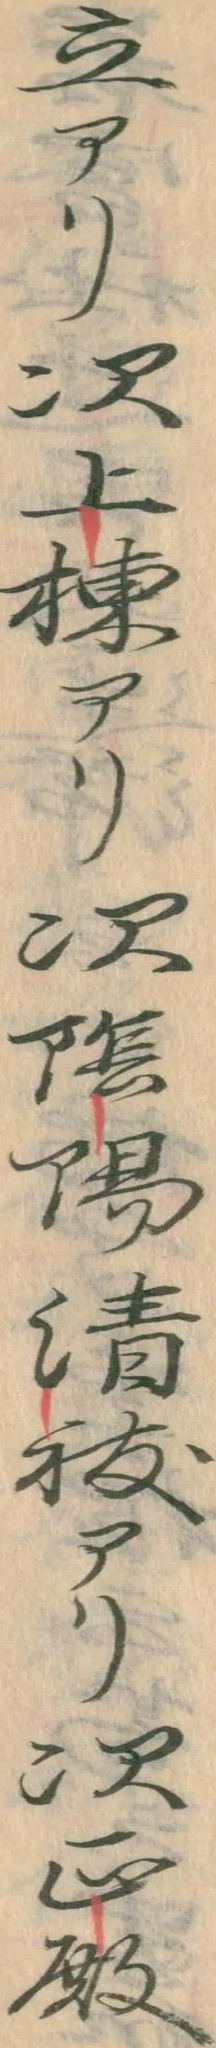立アリ次上-棟アリ次陰-陽清_祓アリ次正-殿
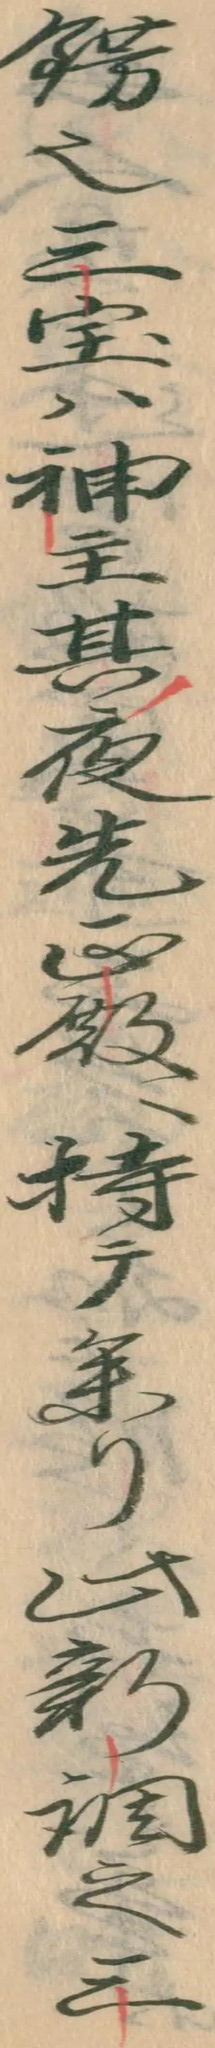錺也三-宝ハ神_主其夜先正-殿ヘ持テ参リ此新-調之三-
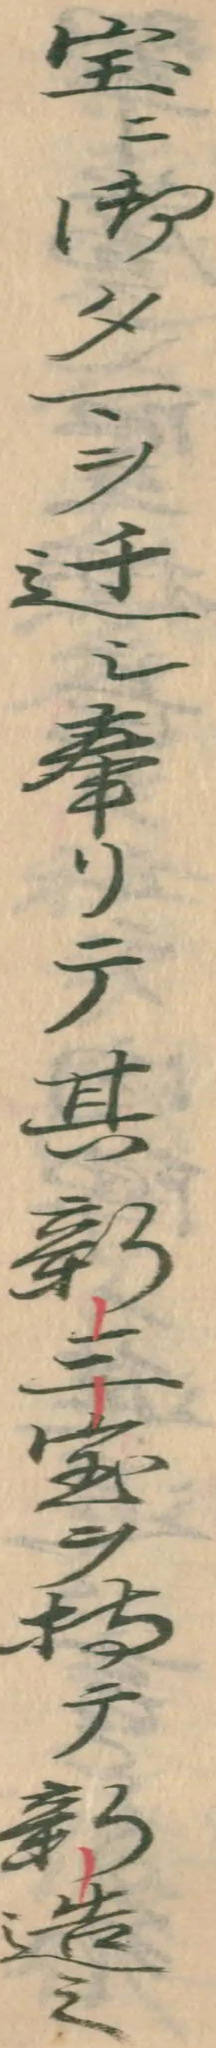宝ニ御タマヲ迁シ奉リテ其新-三-宝ヲ持テ新-造之
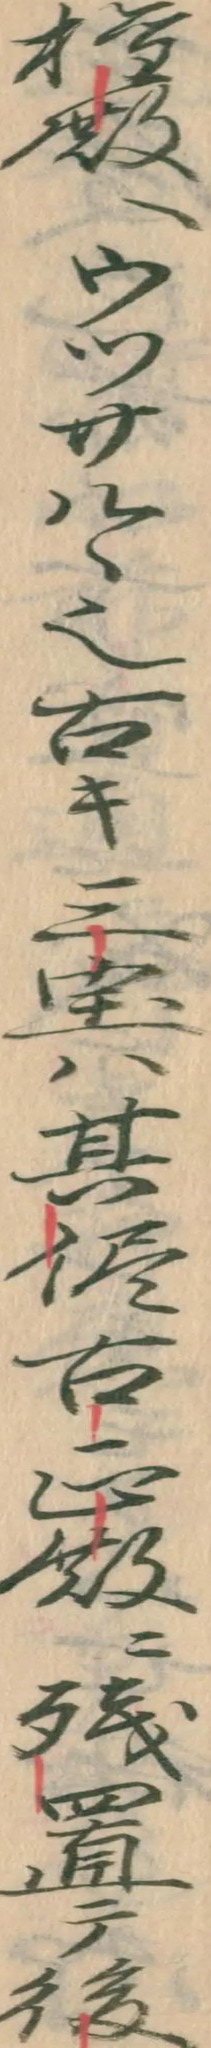権-殿ヘウツサルヽ也古キ三-宝ハ其_侭古-正-殿ニ残_置テ後-
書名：賀茂社記録. 第16冊
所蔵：国立国会図書館 National Diet Library, JAPAN
